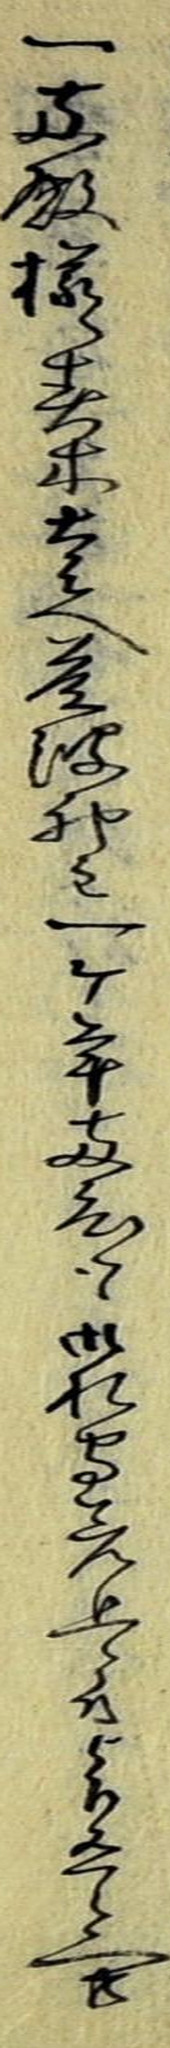一両殿様へ春木太夫藤波神主一ヶ年両度つヽ御札守差上候に付被下有之候へ共

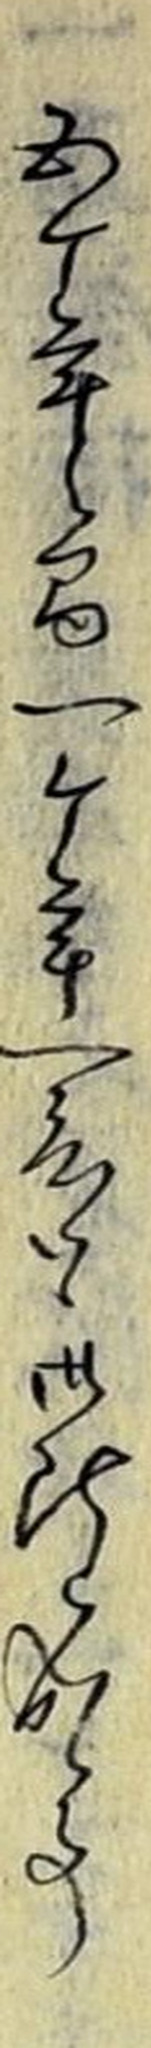五ヶ年之間一ヶ年一度つヽ御断被成候事
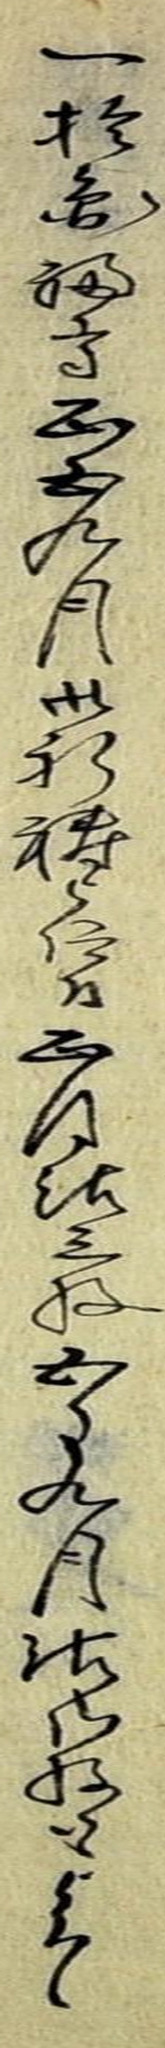一於円福寺正五九月御祈祷被仰付正月銀三枚五月九月銀弐枚ツゝ被候
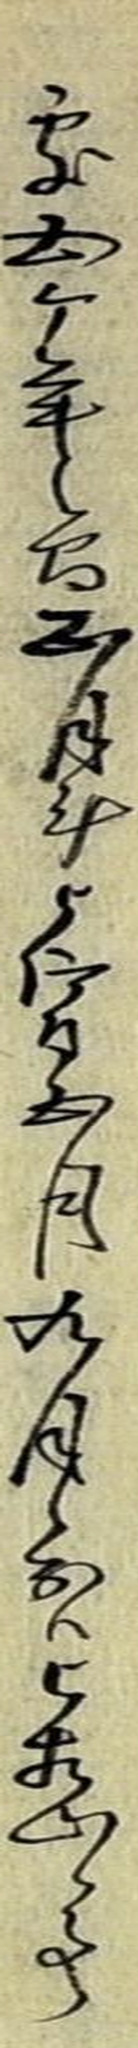処五ヶ年之間正月斗被仰付五月九月之分は被相止候事
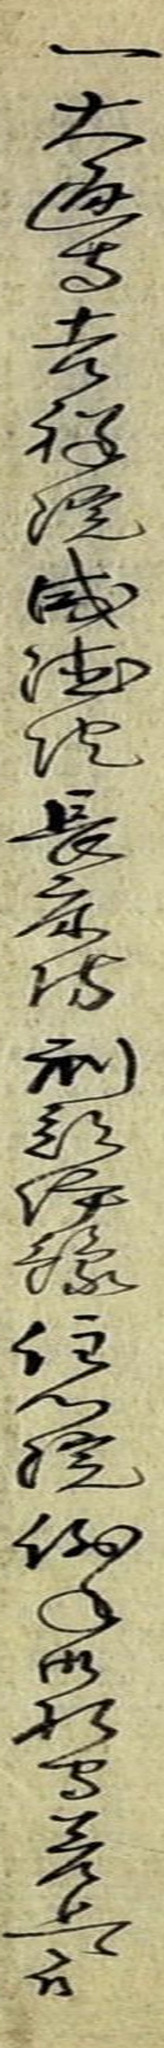一大通寺吉祥院威徳院長床坊刑部伊豫住心院例年御札守差上候に付
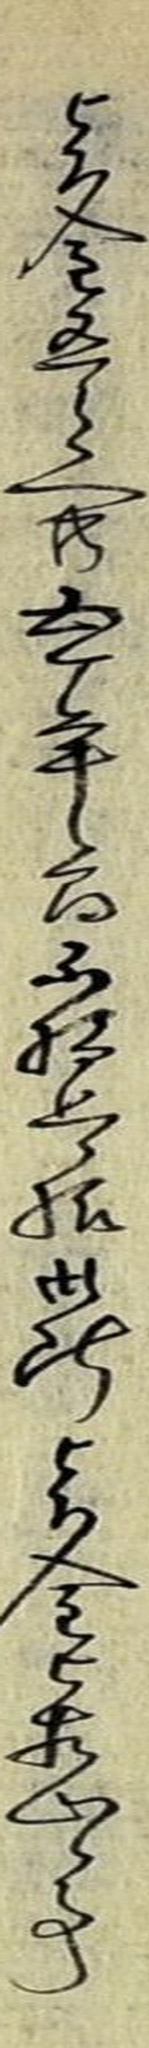被下金有之候へ共五ヶ年之間不指上候様御断被下金被相止候事
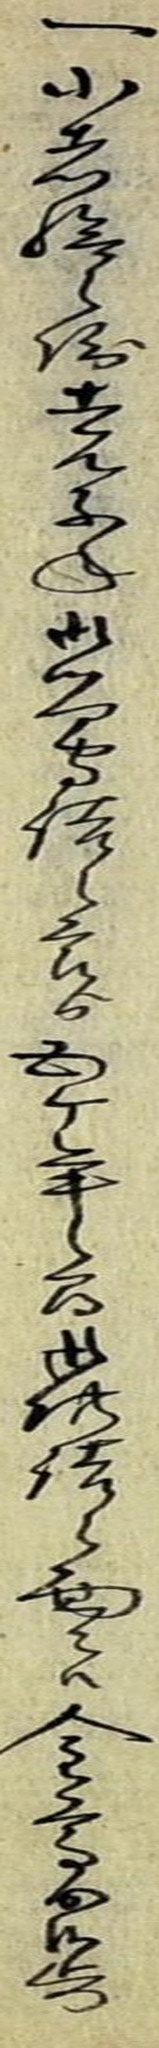一小者給之儀去ル子年御留守詰之節ゟ五ヶ年之間御供詰之面々は金高ゟ弐歩
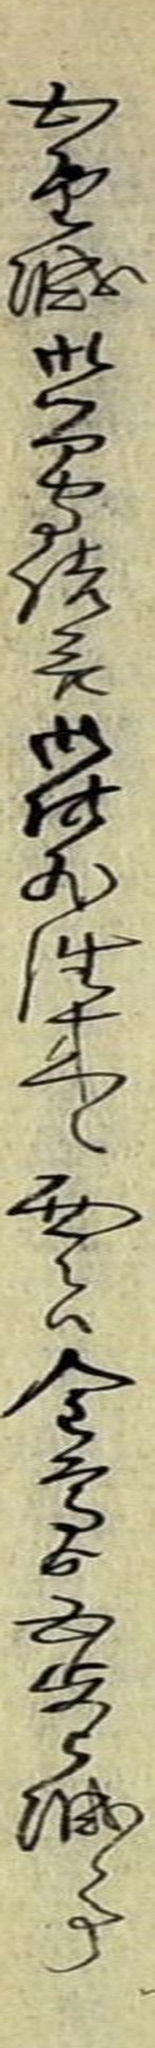五厘減御留守詰并御供外往来之面々は金高ゟ五歩被減候事
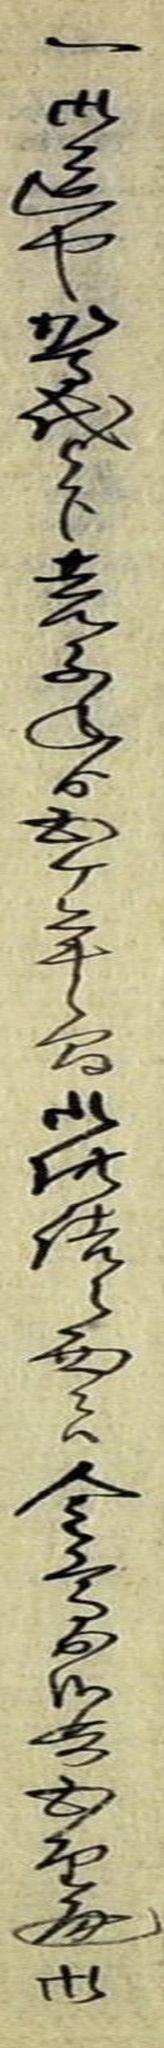一御道中駕代被下去ル子年ゟ五ヶ年之間御供詰之面々には金高ゟ弐歩五厘通御
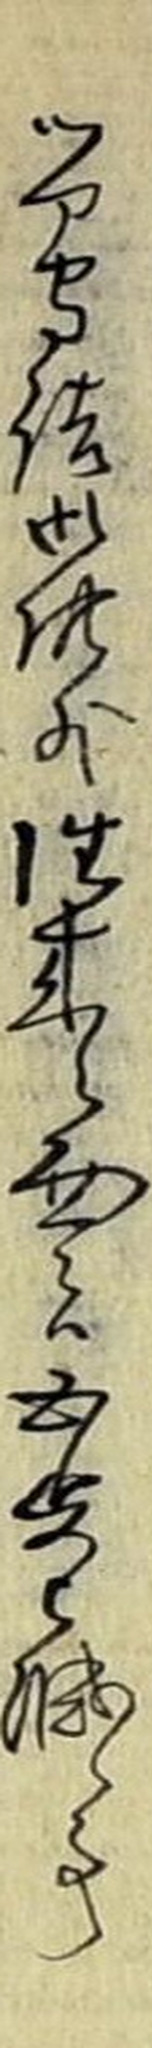留守詰御供外往来之面々には五歩被減候事
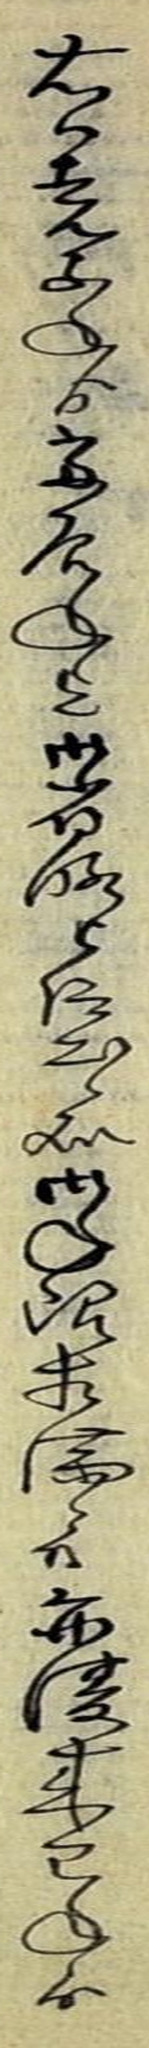右は去ル子年ゟ当辰年迄御省略被仰出候処御年限相満候に付亦復来巳年ゟ
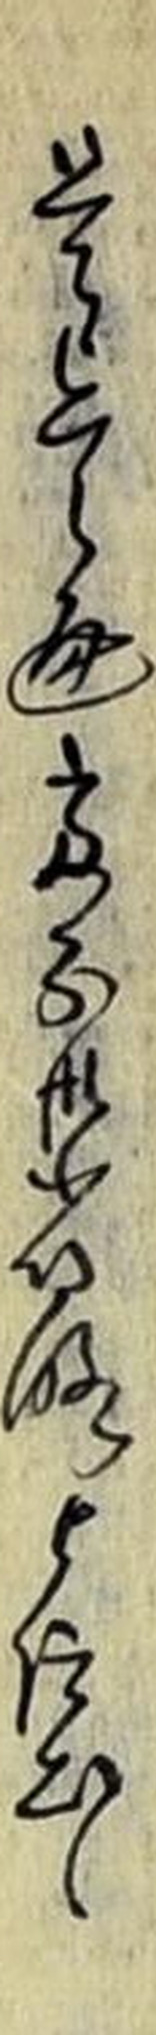是迄之通当分御省略被仰出候
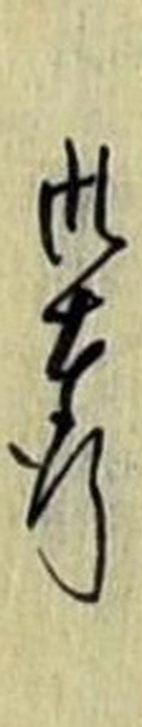御奉行
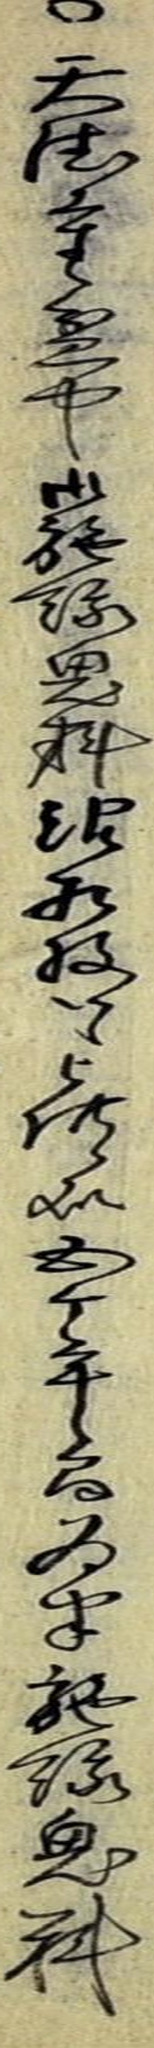○天徳寺へ盆中御施餓鬼料銀拾枚つヽ被供候処五ヶ年之間為半施餓鬼料
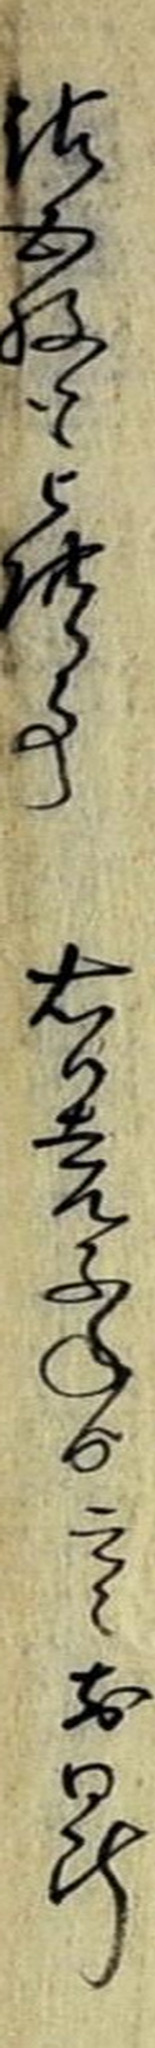銀五枚つヽ被供候事右は去ル子年ゟ云々前同断
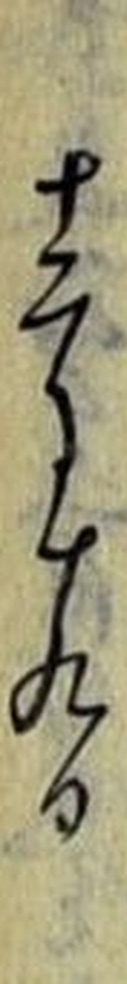十二月十九日
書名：命令之部 四
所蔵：福井県文書館 Fukui Prefectural Archives
